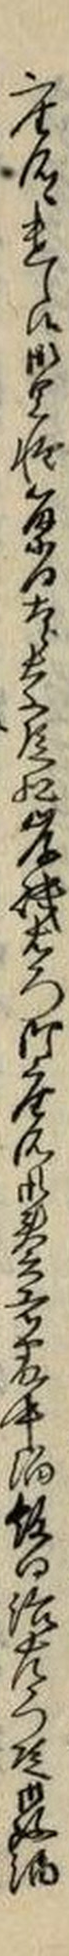座所へ遣候御足軽簗田太郎太夫殿組岸磯右衛門御座所御奏者番中泊飯田治左衛門殿御改泊
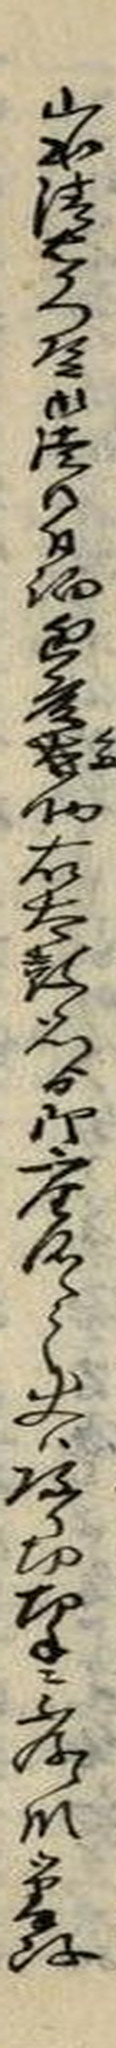山本清右衛門殿御徒目付泊近藤多助右太鼓御門ゟ御座所へ之使は帰り切切手に不及候段御番改
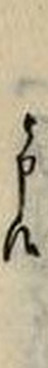被申候
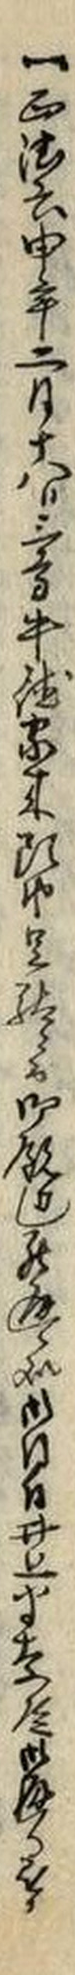一正徳六申年二月十八日三寺牛徳家来頭巾足駄にて御厩辺罷通候処御目付井上半太夫殿御通り懸り
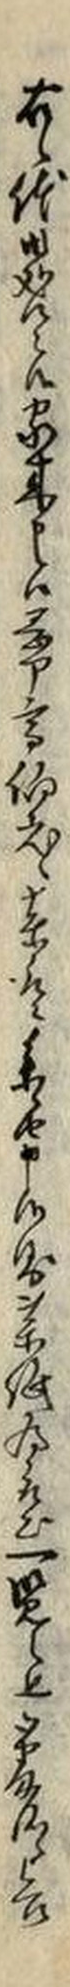右之体御咎に候家来申候は岡部高伯老へ薬取に参候由申候則薬紙為取出一覧之上御番所へ被召
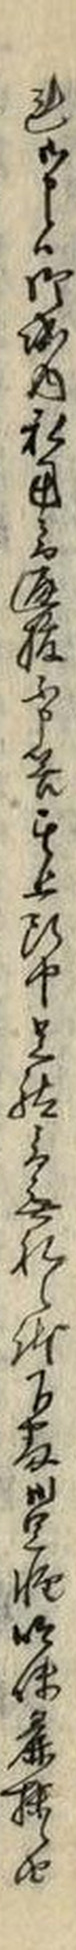連御申候は御城内私用に而通抜不申筈其上頭巾足駄に而無礼之体下番御足軽吟味麁抹候由
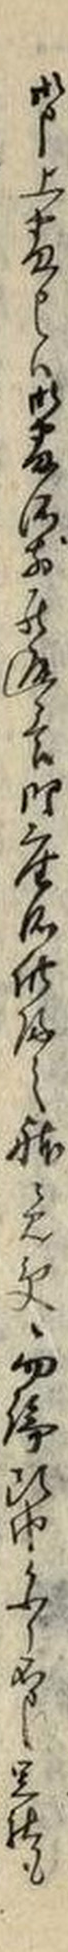御申上番申候は御番所前罷通候節御座所供帰之体に見受候勿論頭巾かふり不申足駄も
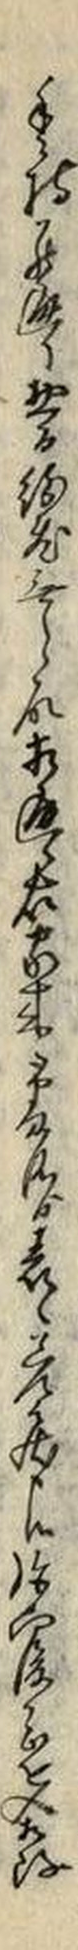手持罷通り惣而紛敷無之候故相通候右家来御番所ゟ表へ差戻申候弥向後念を入相改
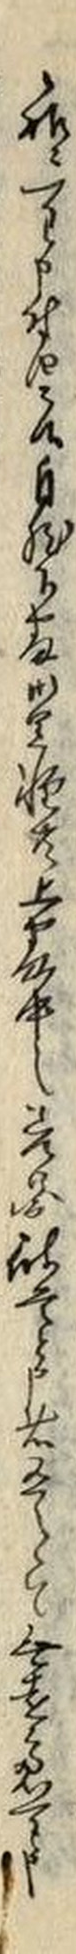候様に可被申付候由に候自然下番御足軽共へ上番中之差図彼是と申者有之候ハヽ無遠慮可被申
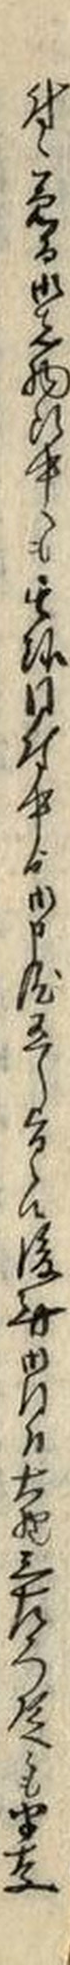付候兼而御先物頭中へも其趣目付中ゟ御申渡有之旨に候後刻御目付大野三左衛門殿へも半太夫
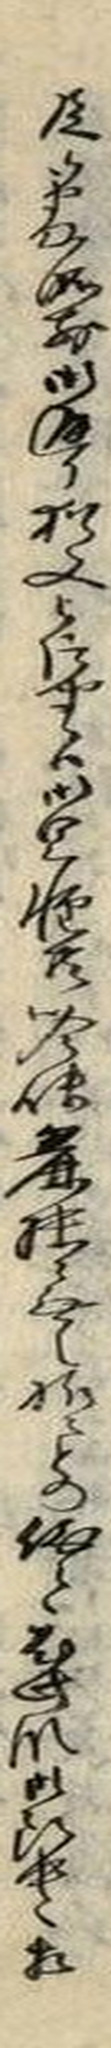殿御番所前御通り猶又被仰聞候は御足軽共吟味麁抹に無之候様にとの儀に候尤此段御頭中へ相
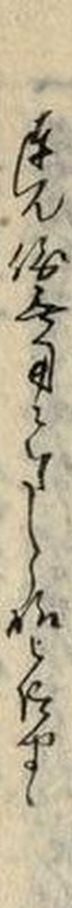達候儀無用にいたし候様被仰聞候
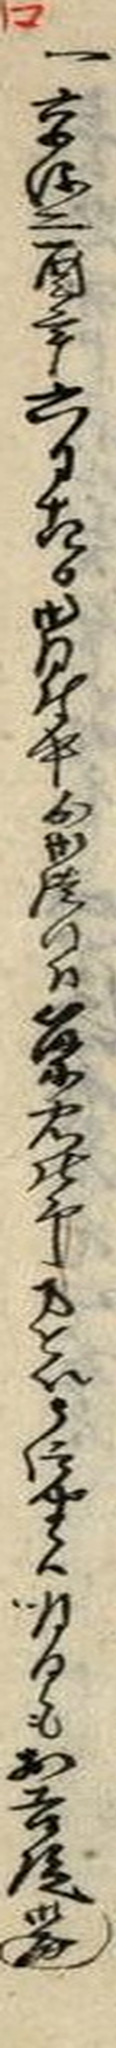一享保二酉年六月十四日御目付中ゟ御徒目付簗忠次郎方を以被仰聞候ハ明日にもお吉殿御通

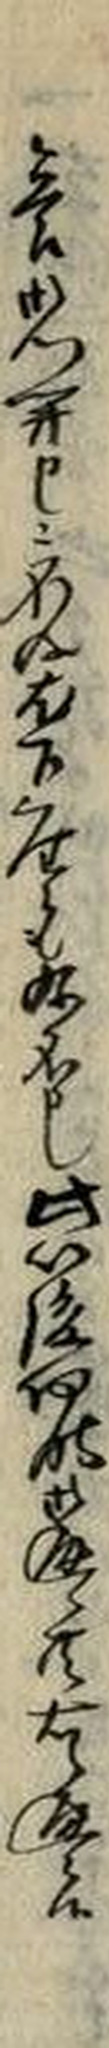候節御門開申候に不及尤下座にも及不申候此以後何時御通候共右之通に候
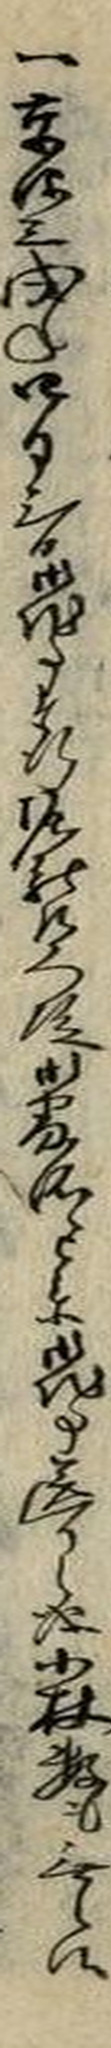一享保三戌年四月三日御作事奉行堀新左衛門殿御番所へ被参御作事送り之儀小杖数も無之候
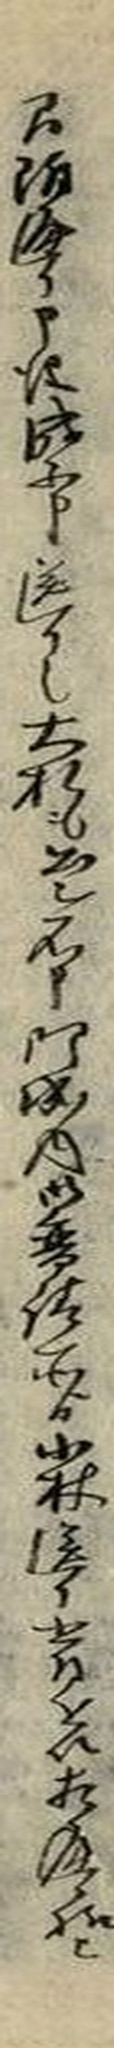間附通り申儀成不申送り候大札も出し不申御城内御普請所ゟ小杖送り書付を以相通候様に
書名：御門御櫓之部
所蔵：福井県文書館 Fukui Prefectural Archives
